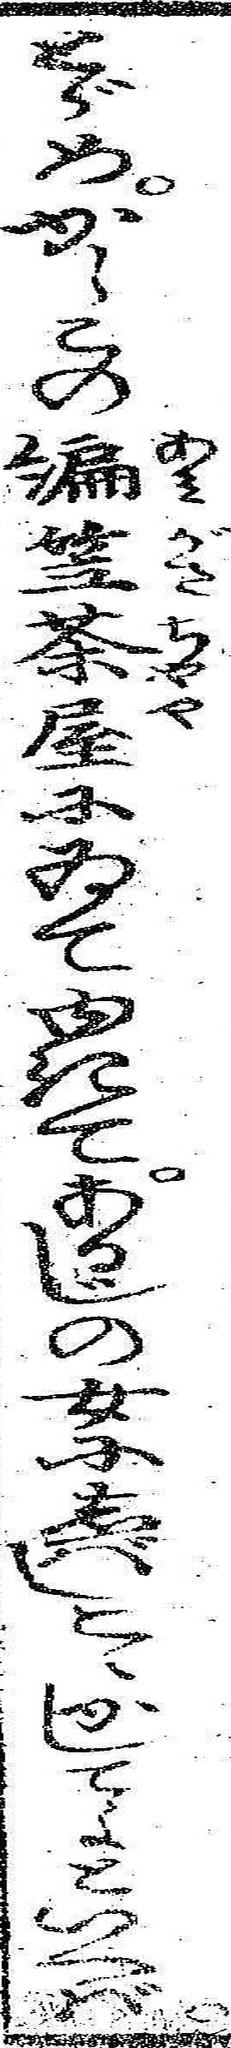とゞめ。かしこの編笠茶屋にゐてゆきて。あるじの女にしばしこゝかしてよといへば。

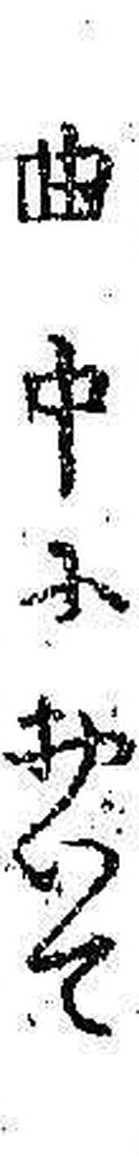曲中において
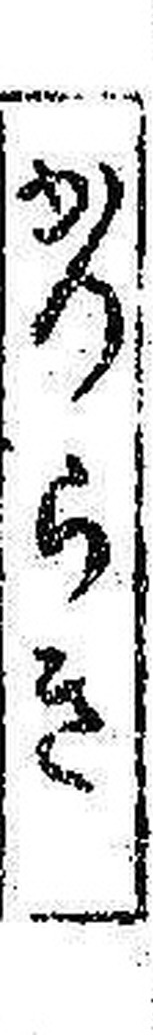かつらき

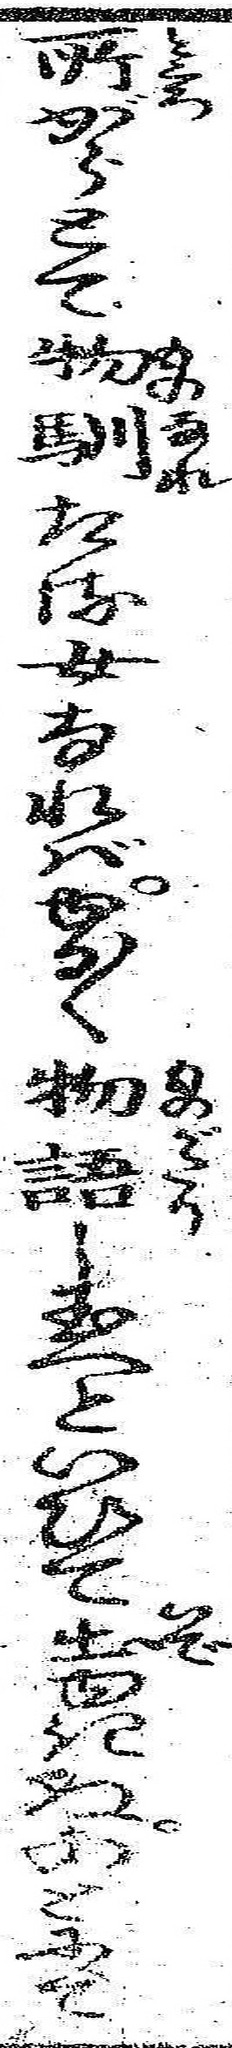所がらとて物馴たる女なれば。ゆる〳〵物語し玉へといひて出ゆきぬ。あとにて
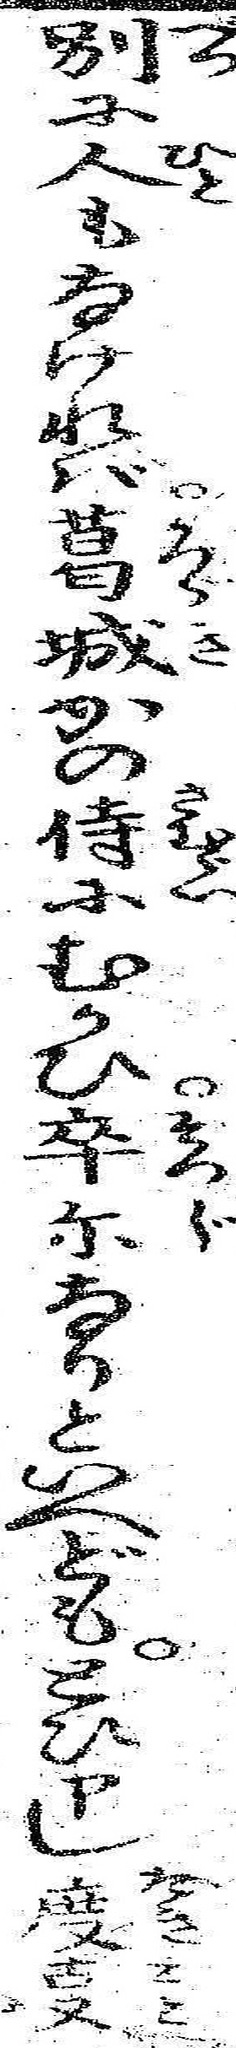別に人もなければ。葛城かの侍にむかひ。卒爾なりといへども。とひ申し度事
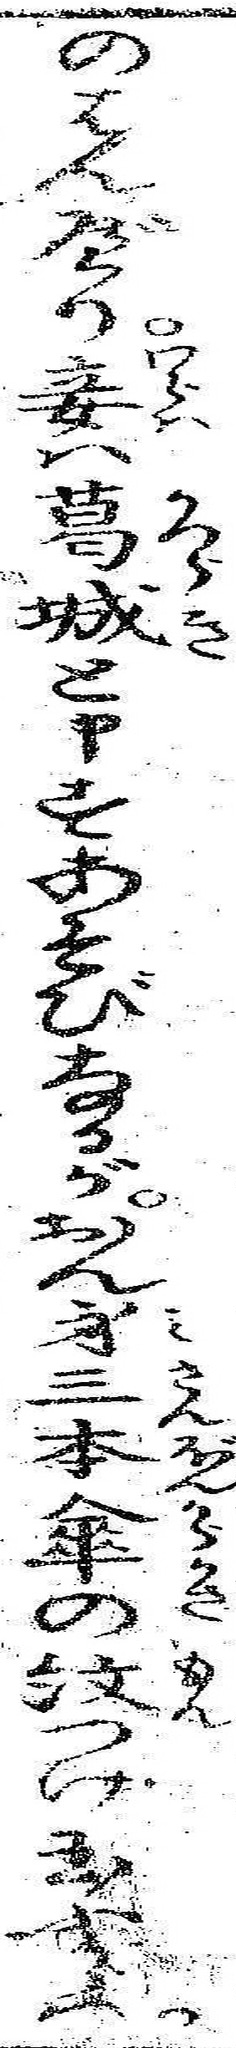のはんべり。妾は葛城と申すあそびなるが。おん身三本傘の紋つけ玉ふからは。
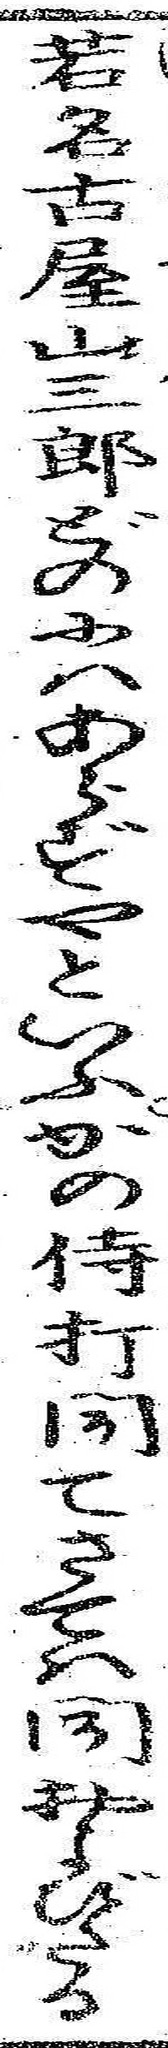若名古屋山三郎どのにはあらずやといふ。かの侍打聞てさては聞およびたる
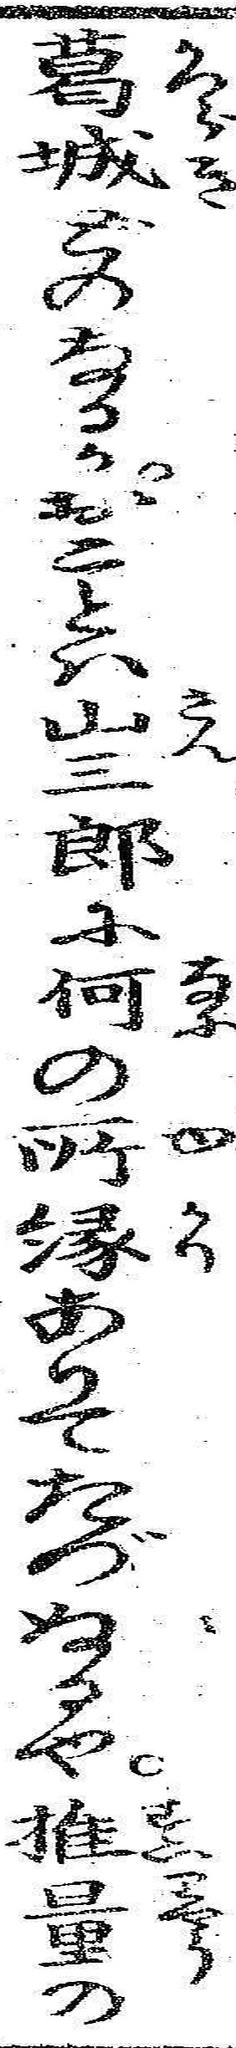葛城どのなるか。おことは山三郎に何の所縁ありてたづぬるや。推量の
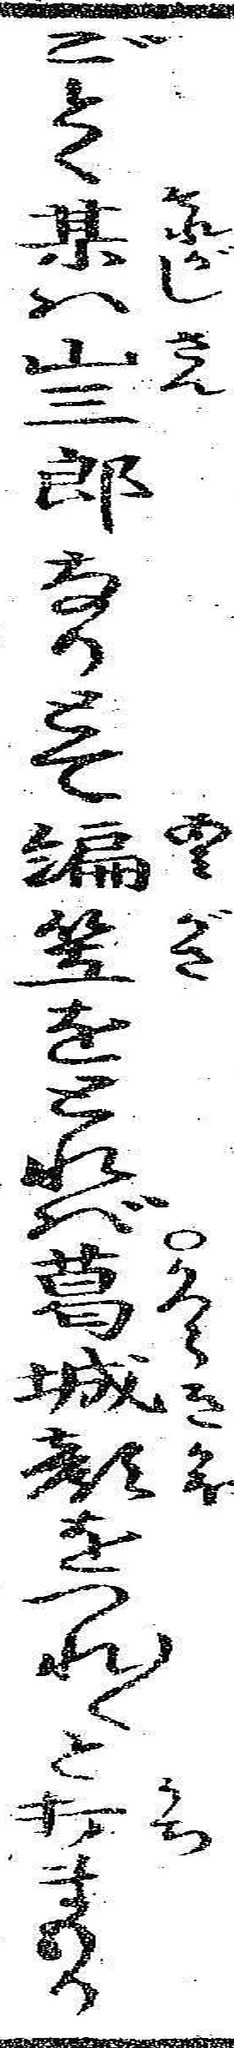ごとく某は山三郎なりとて編笠をとれば。葛城顔をつれ〳〵と打まもり
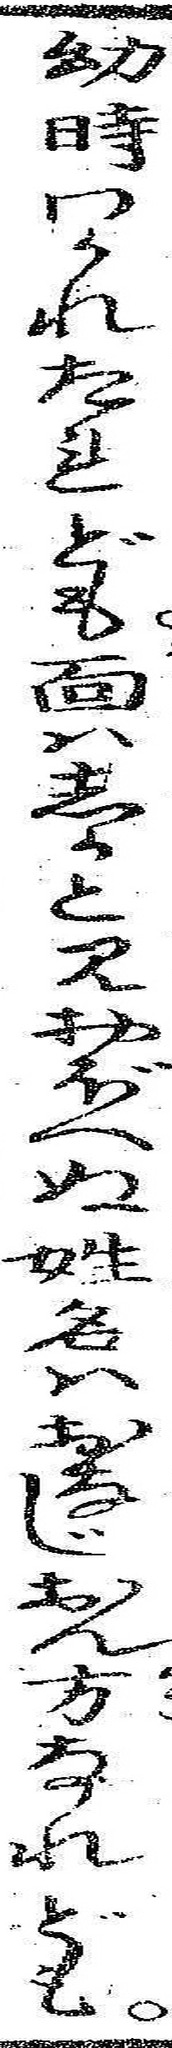幼時わかれたれども。面はしかと見おぼへぬ。姓名はおなじおん方なれども。
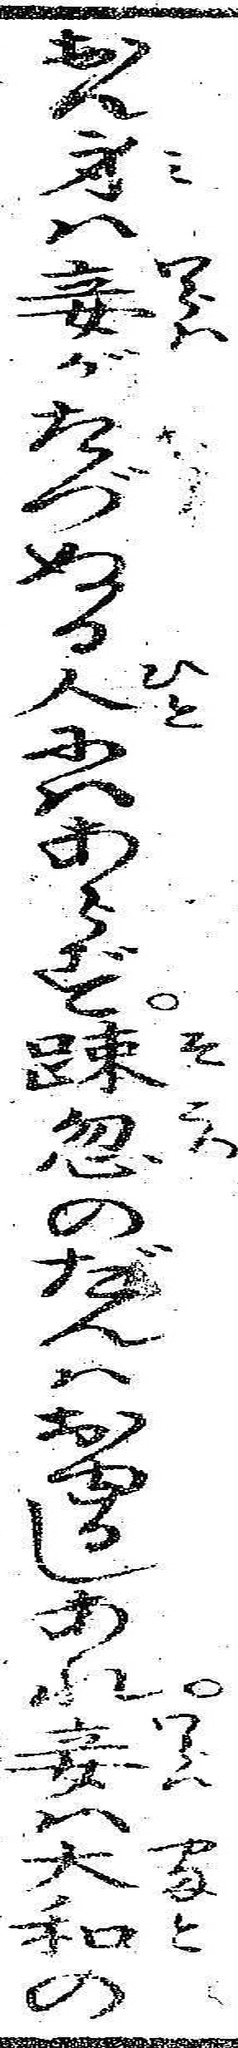おん身は妾がたづぬる人にはあらず。疎忽のだんはおゆるしあれ。妾は大和の
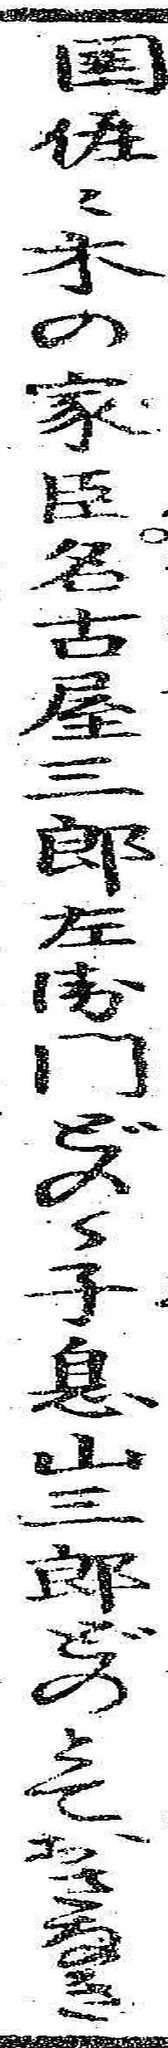国佐々木の家臣。名古屋三郎左衛門どのゝ子息山三郎どのとて。おさなき
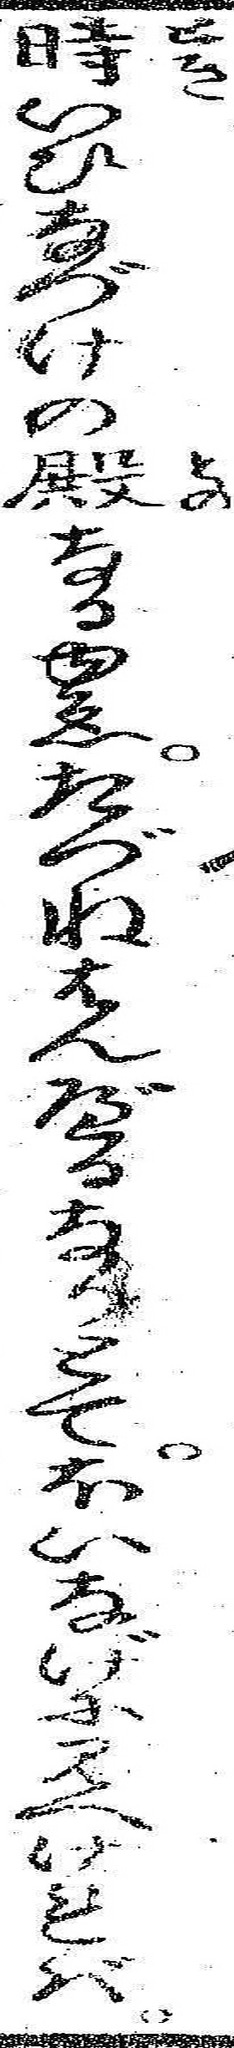時いひなづけの殿なるゆゑ。たづねはんべるなりとて。ほいなげに見へければ。
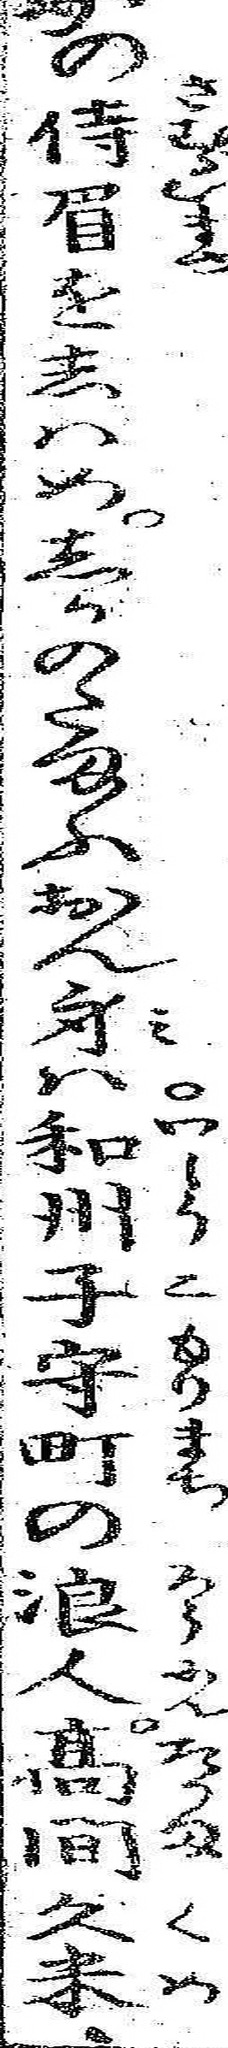かの侍眉をしはめ。しかのたまふおん身は。和州子守町の浪人。高間久米
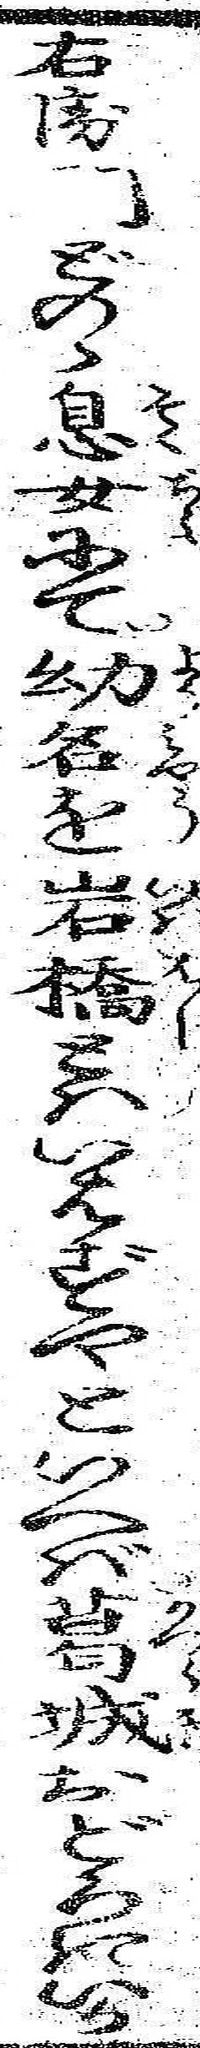右衛門どのゝ息女にて。幼名を岩橋とはいはずやといへば。葛城おどろきいか
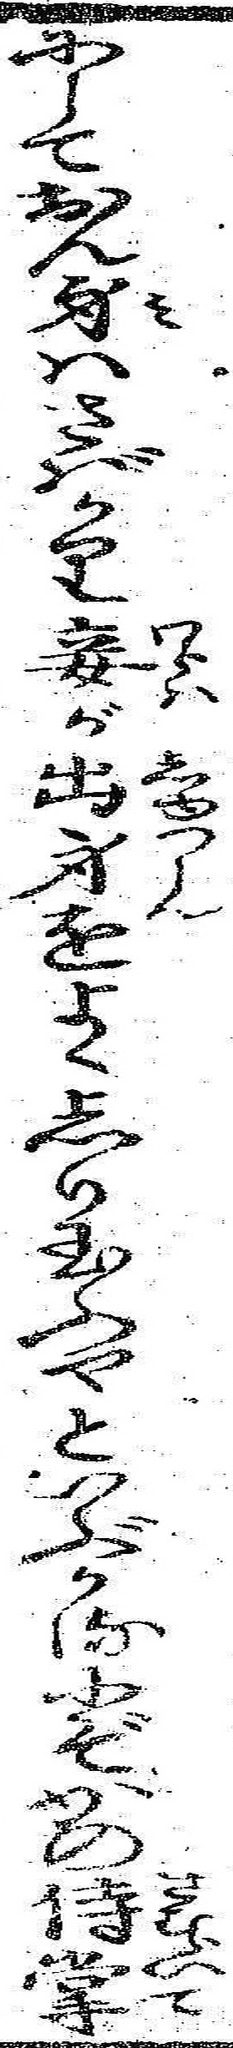にしておん身はさばかり妾が出身をよくしり玉ふやといぶかるにぞかの侍掌
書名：昔話稲妻表紙
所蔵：国文学研究資料館
